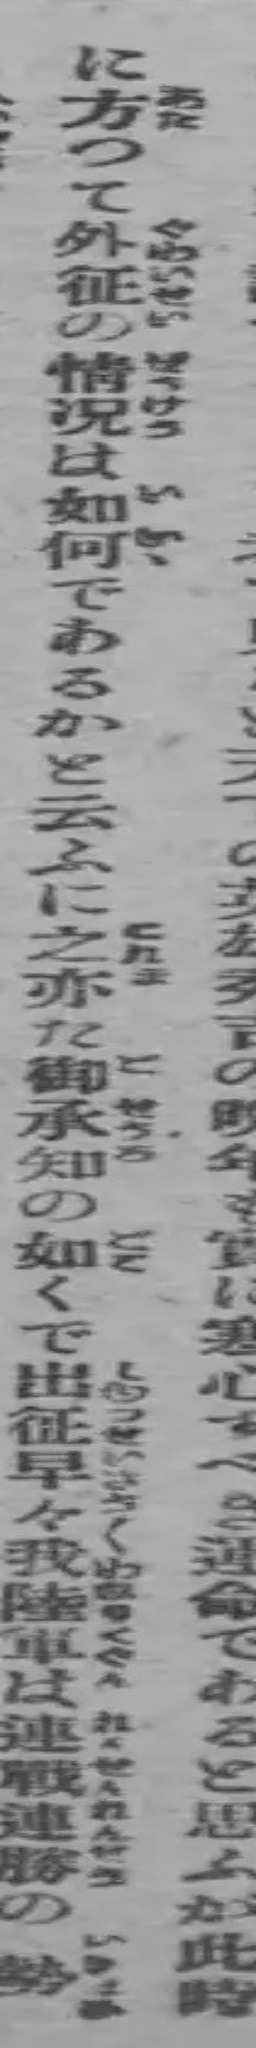に方つて外征の情況は如何であるかと云ふに之亦た御承知の如くで出征早々我陸軍は連戦連勝の勢
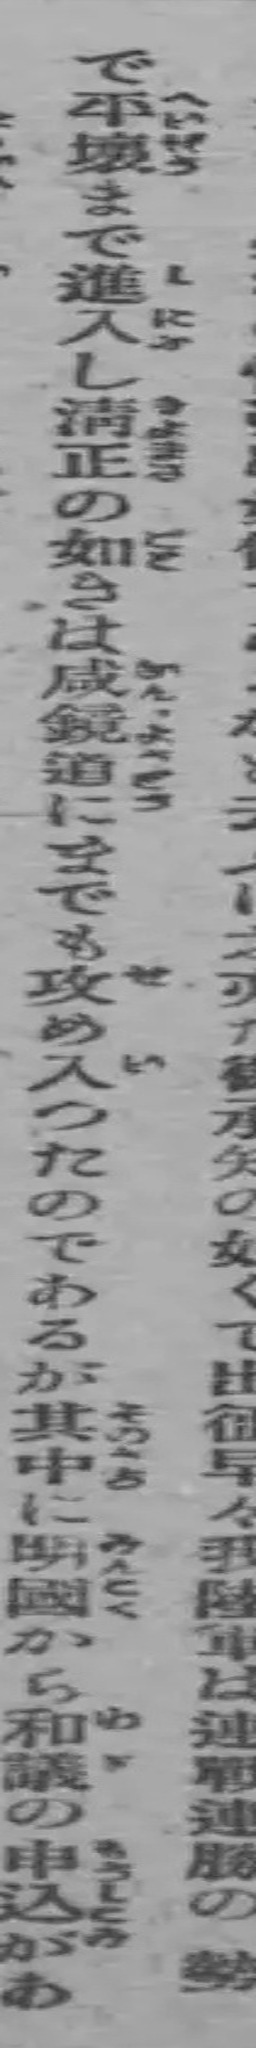で平壌まで進入し清正の如きは咸鏡道にまでも攻め入つたのであるが其中に明国から和議の申込があ
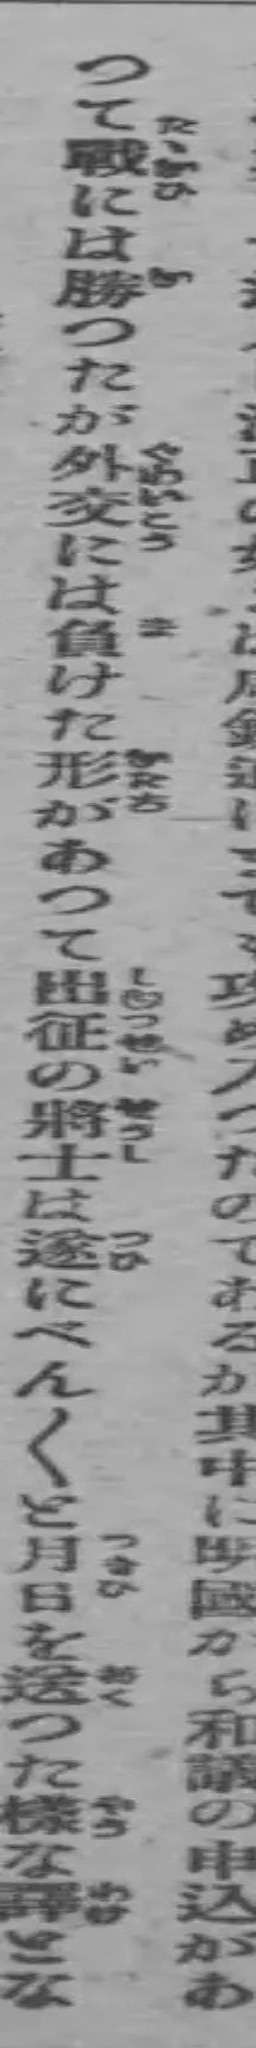戦勝と外交つて戦には勝つたが外交には負けた形があつて出征の将士は遂にべん〳〵と月日を送つた様な訳とな
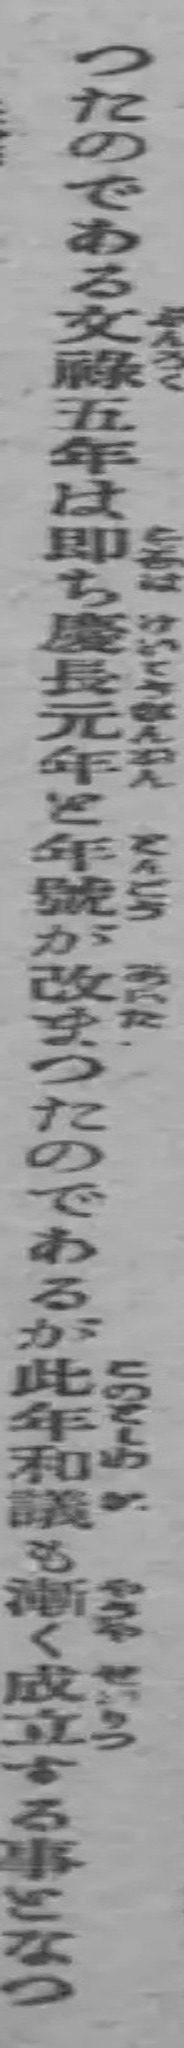つたのである文禄五年は即ち慶長元年と年号が改まつたのであるが此年和議も漸く成立する事となつ
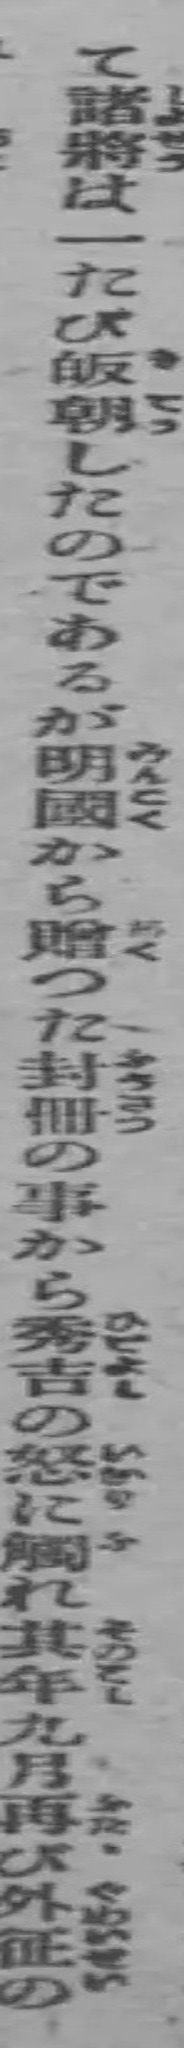て諸将は一たび皈朝したのであるが明国から贈つた封冊の事から秀吉の怒に触れ其年九月再び外征の
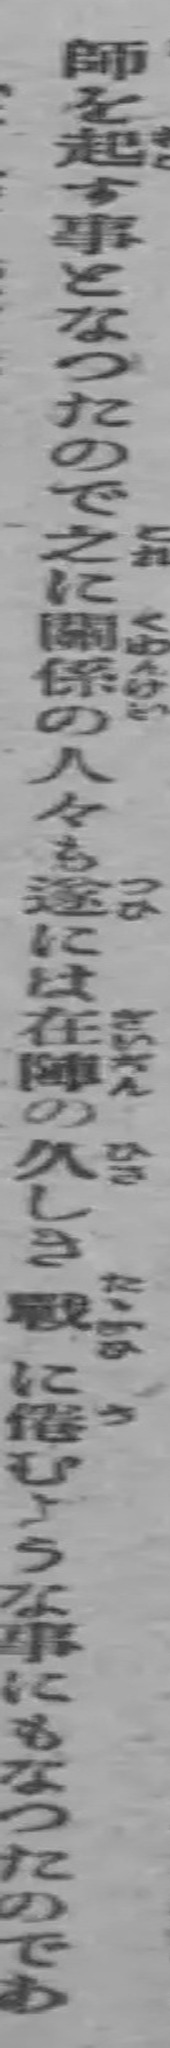師を起す事となつたので之に関係の人々も遂には在陣の久しき戦に倦むようなこと事にもなつたのであ
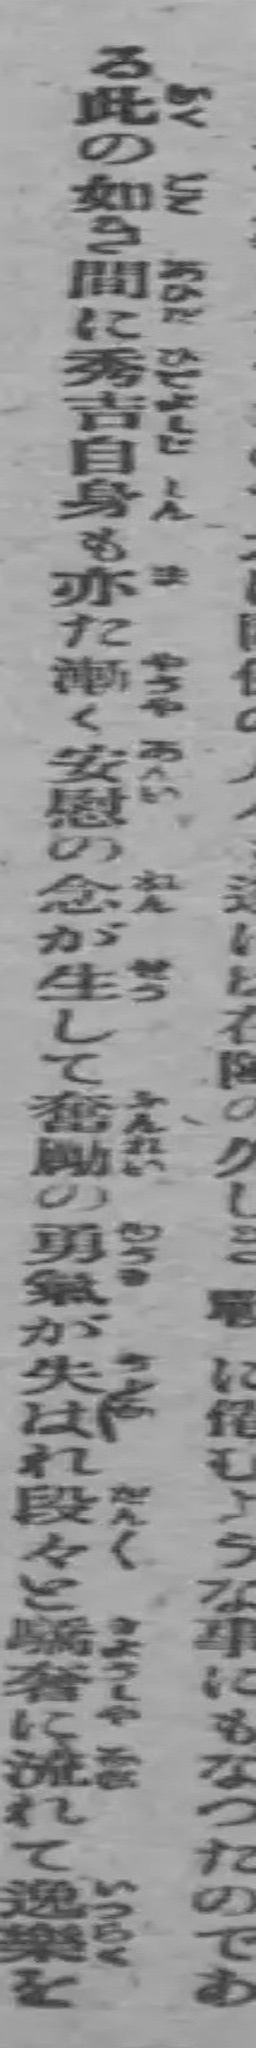る此の如き間に秀吉自身も亦た漸く安慰の念が生して奮励の勇気が失はれ段々と驕奢に流れて逸楽を
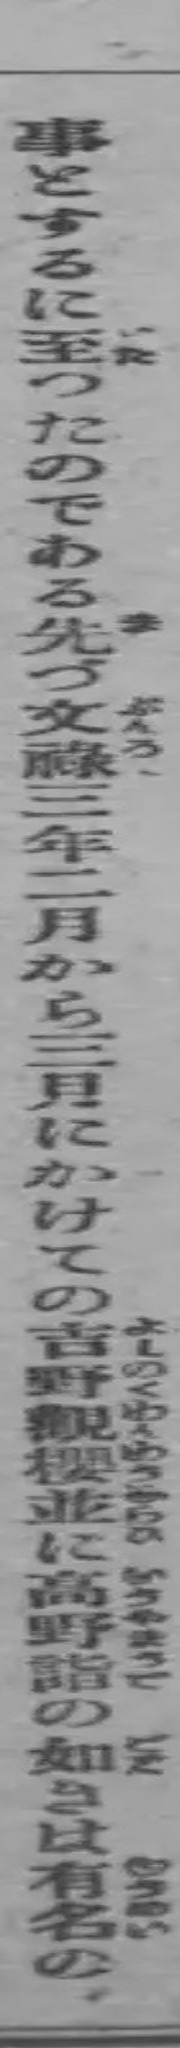事とするに至つたのである先づ文禄三年二月から三月にかけての吉野観桜並に高野詣の如きは有名の
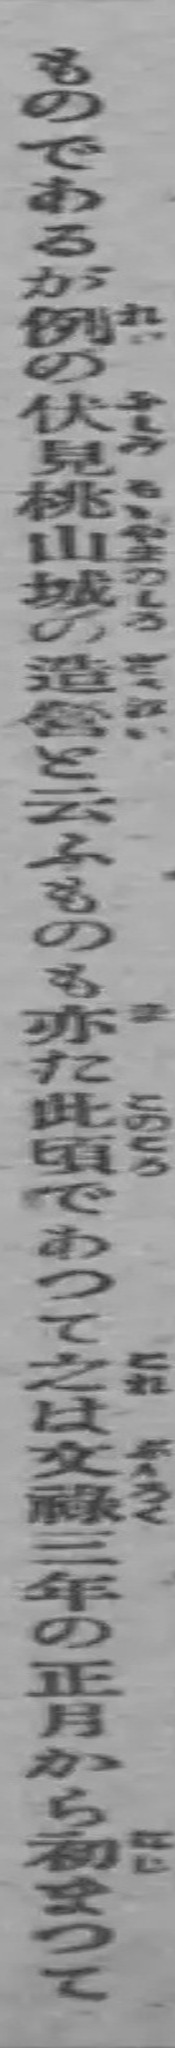桃山城ものであるが例の伏見桃山城の造営と云ふものも亦た此頃であつて之は文禄三年の正月から初まつて
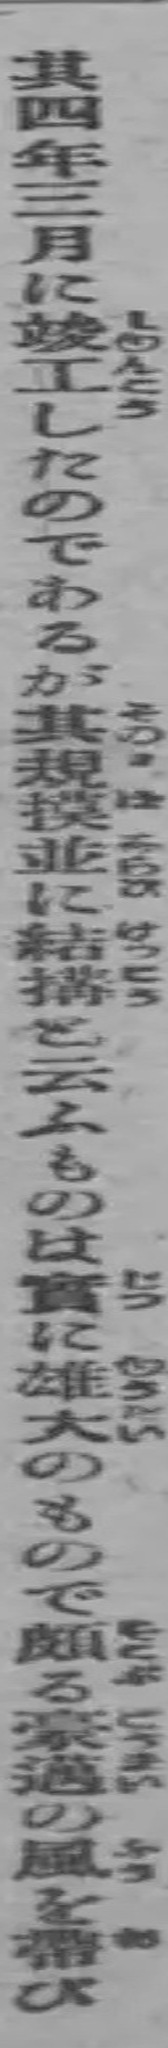其四年三月に竣工したのであるが其規模並に結構と云ふものは実に雄大のもので頗る豪邁の風を帯び
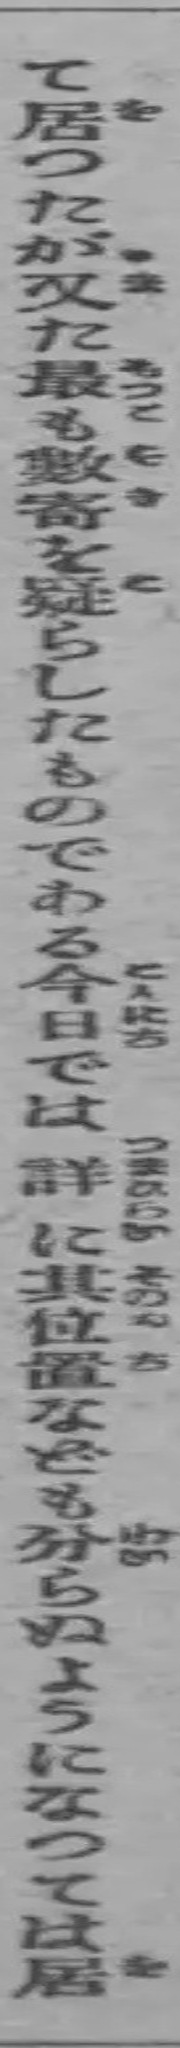て居つたが又た最も数寄を凝らしたもので今日では詳に其位置なども分らぬようになつて居
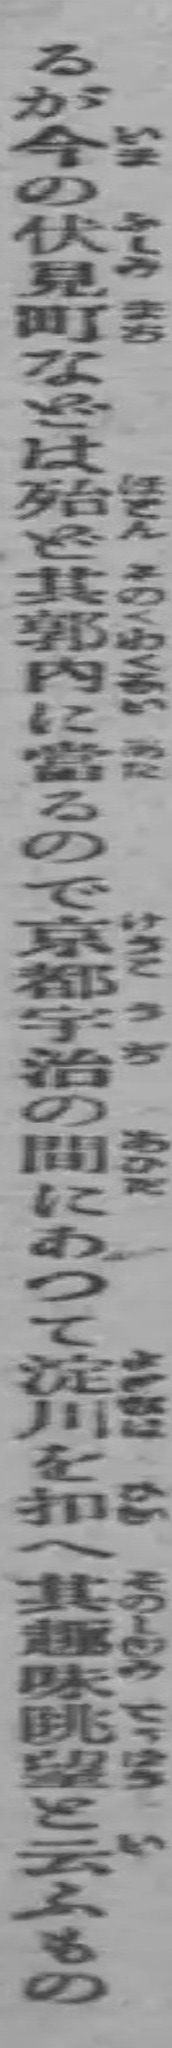るが今の伏見町などは殆ど其郭内に当るので京都宇治の間にあつて淀川を扣へ其趣味眺望と云ふもの
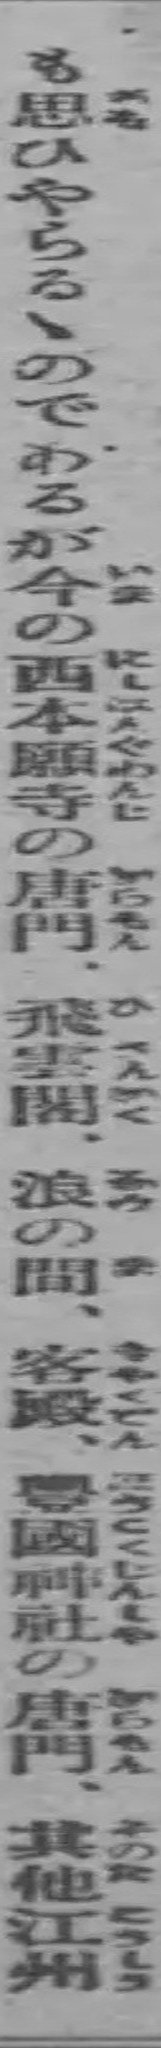も思ひやらるゝのであるが今の西本願寺の唐門、飛雲閣、浪の間、客殿、豊国神社の唐門、其他江州
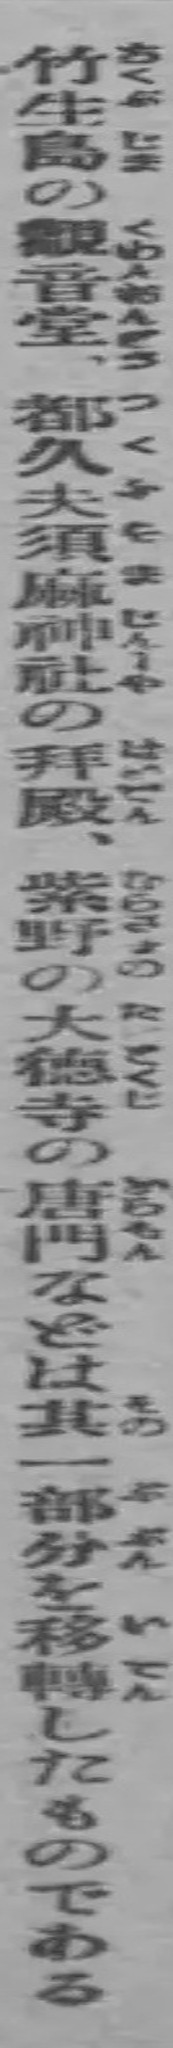竹生島の観音堂、都久夫須麻神社の拝殿、紫野の大徳寺の唐門などは其一部分を移転したものである
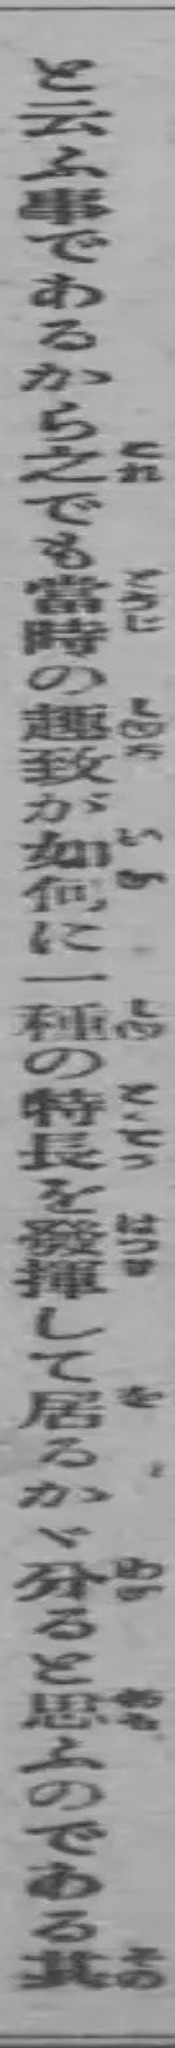と云ふ事であるから之でも当時の趣致が如何に一種の特長を発揮して居るかゞ分ると思ふのである其
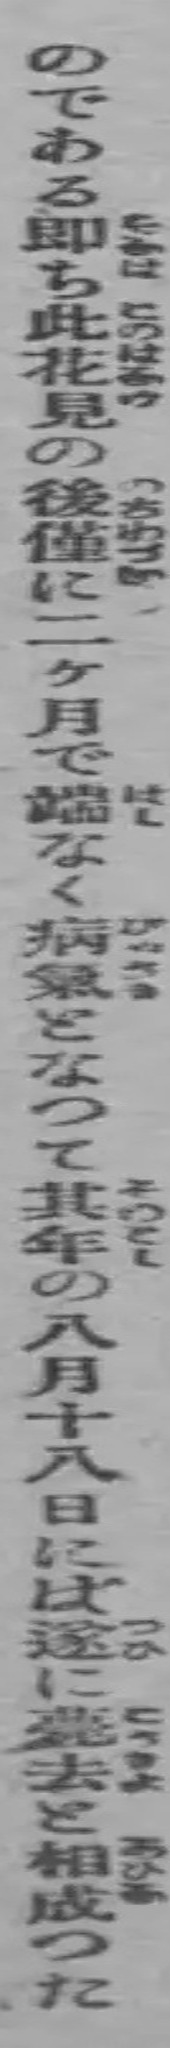秀吉薨去のである即ち此花見の後僅に二ヶ月で端なく病気となつて其年の八月十八日には遂に薨去と相成つた
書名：豊橋市史談
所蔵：国立国会図書館 National Diet Library, JAPAN
